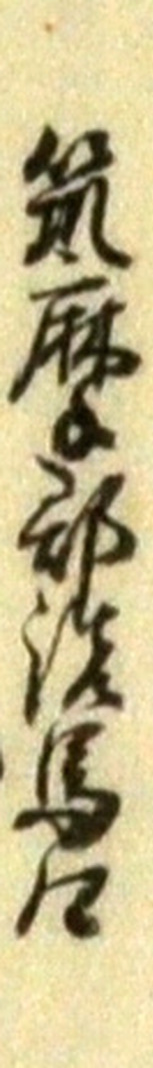筑摩郡洗馬郷
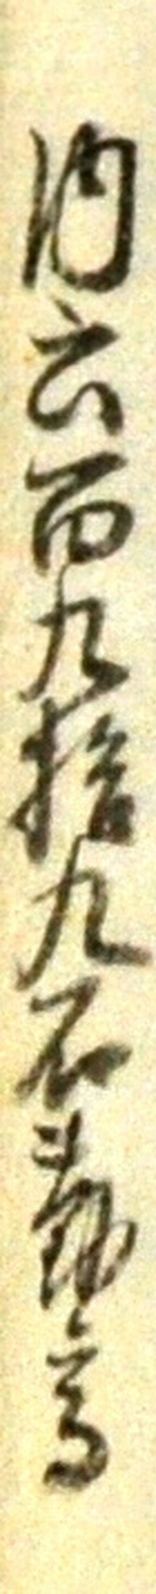内六百九拾九石勤高

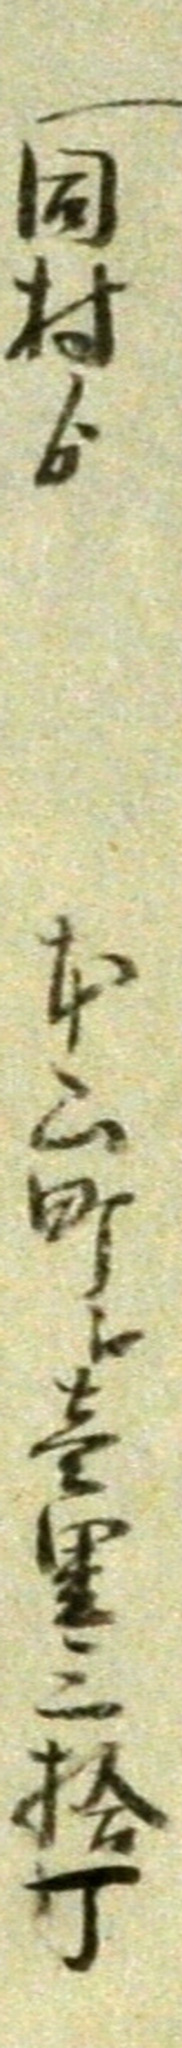同村ゟ本山町江壱里三拾丁
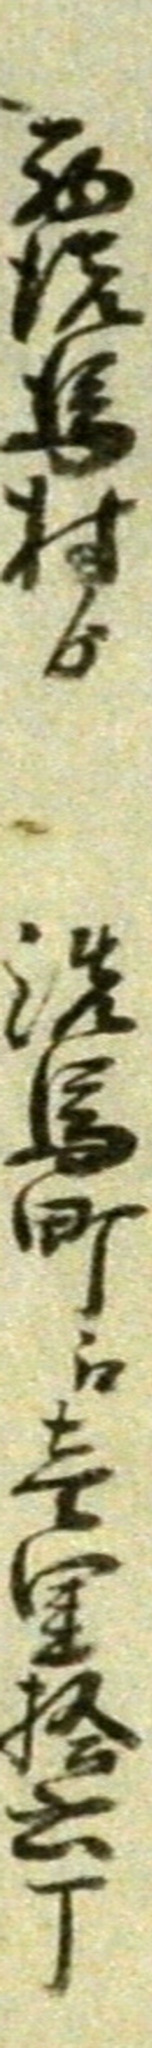西洗馬村ゟ洗馬町江壱里拾六丁
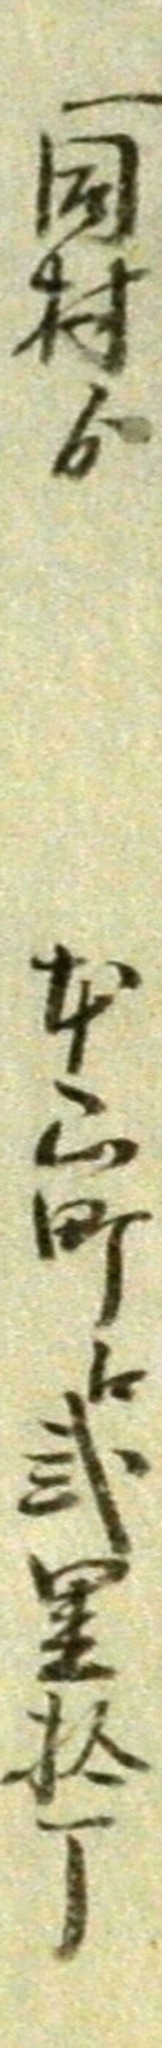同村ゟ本山町江弐里拾丁
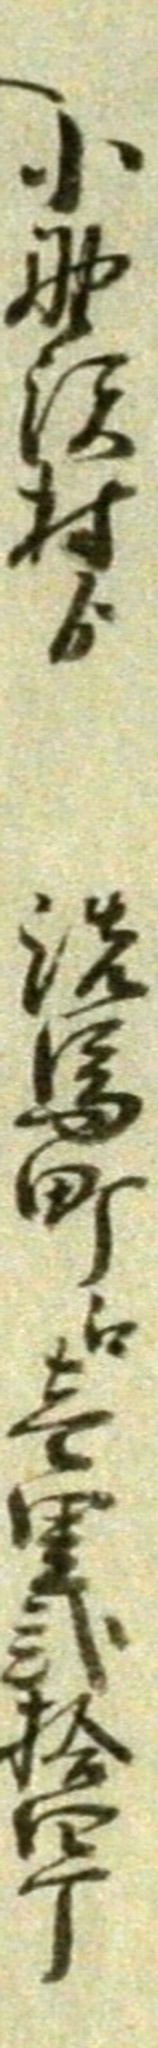小野沢村ゟ洗馬町江壱里弐拾四丁
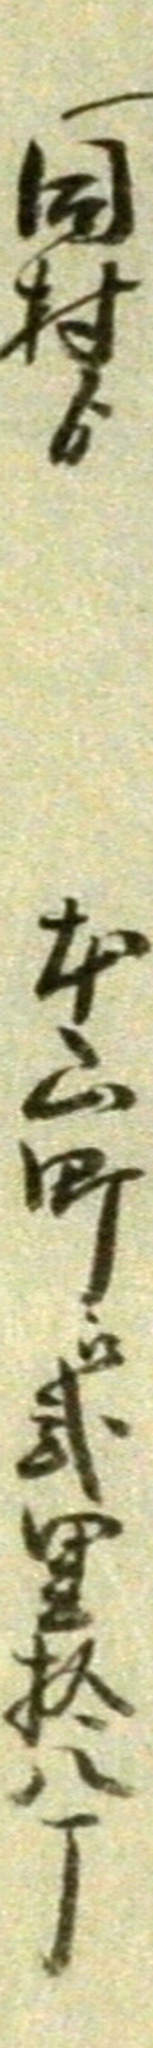同村ゟ本山町江弐里拾八丁
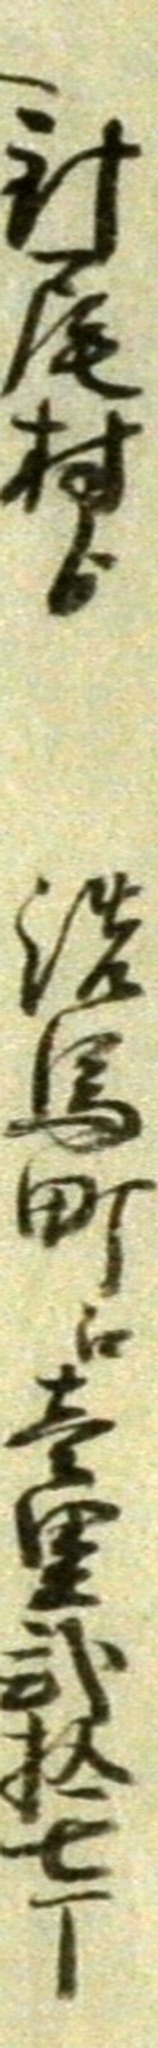針尾村ゟ洗馬町江壱里弐拾七丁
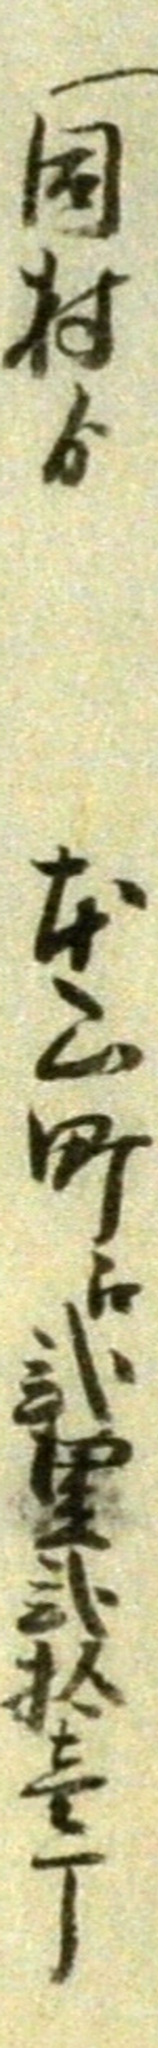同村ゟ本山町江弐里弐拾壱丁
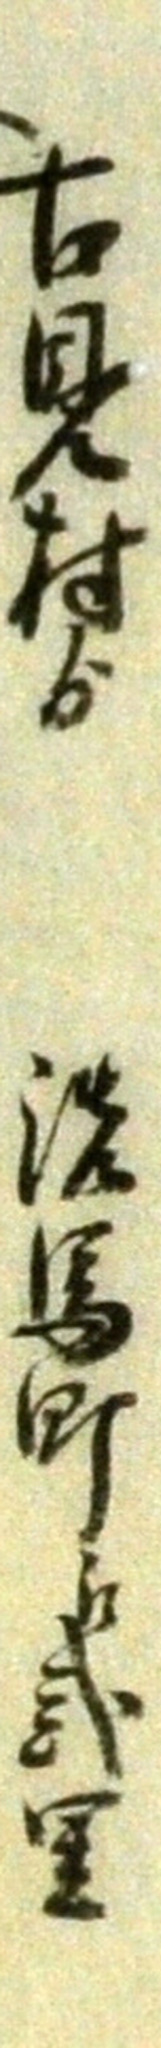古見村ゟ洗馬町江弐里
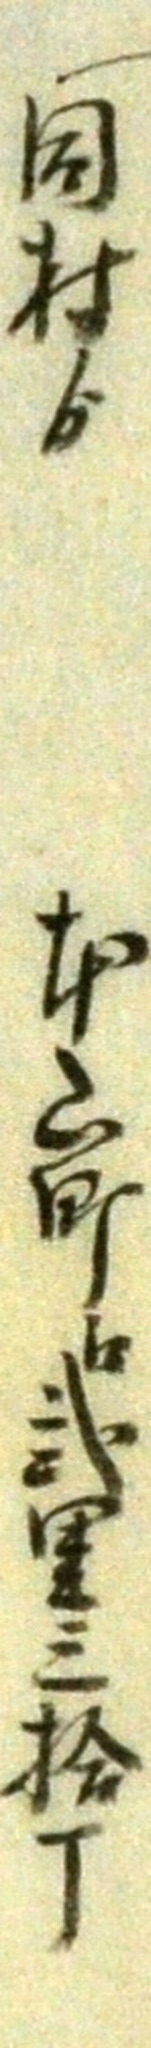同村ゟ本山町江弐里三拾丁
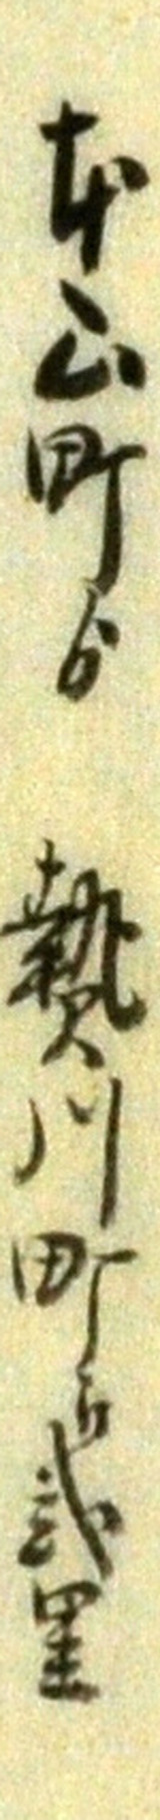本山町ゟ贄川町江弐里
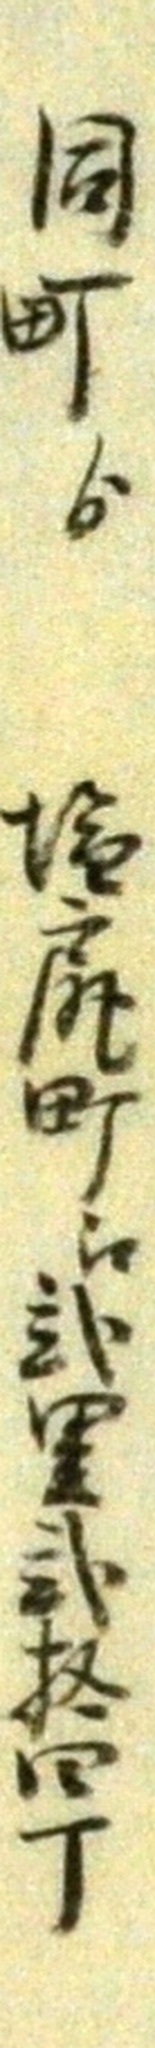同町ゟ塩尻町江弐里弐拾四丁
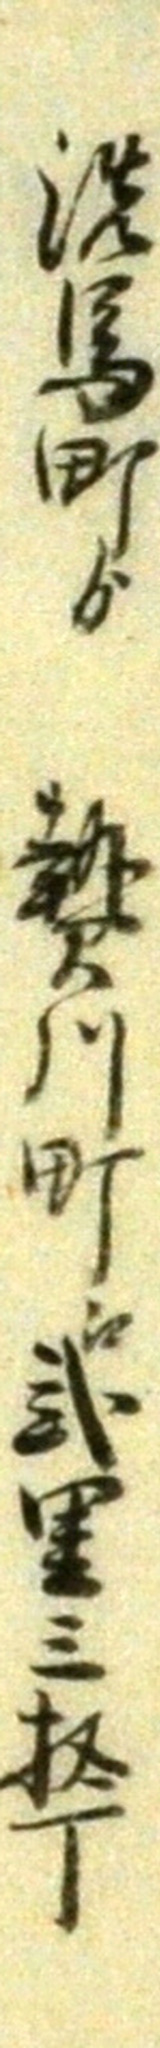洗馬町ゟ贄川町江弐里三拾丁
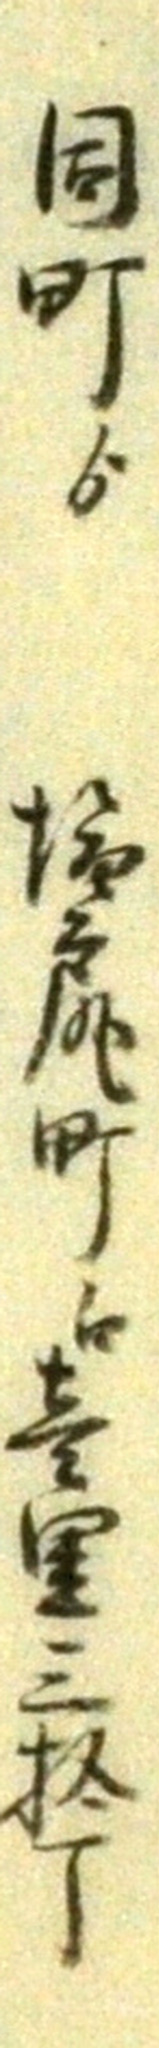同町ゟ塩尻町江壱里三拾丁
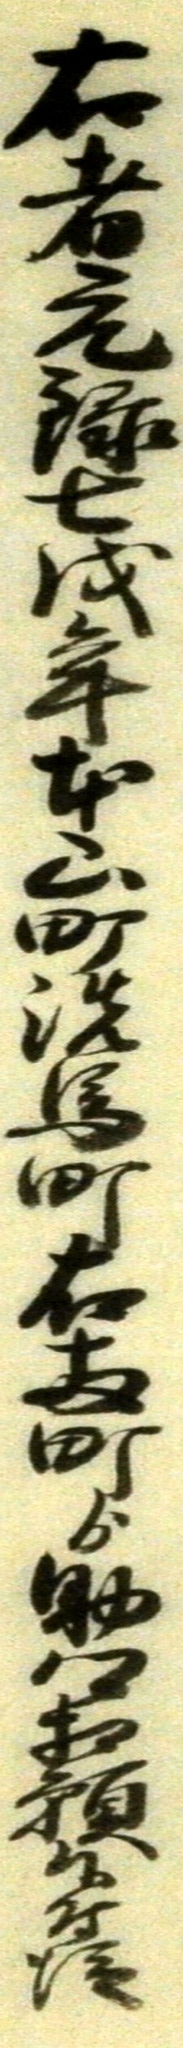右者元禄七戌年本山町洗馬町右両町ゟ助郷相願候付従
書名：御領分拾九箇村木曽助并塩尻町・洗馬町・本山町へ人馬勤覚帳
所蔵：伊那市立高遠町図書館・合同会社AMANE
